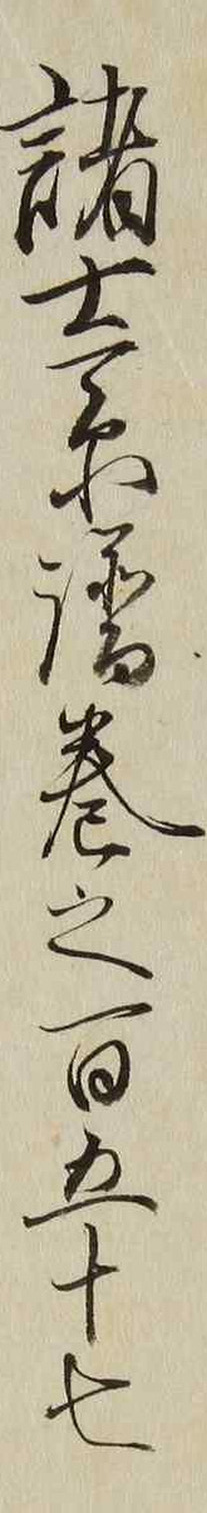諸士系譜巻之百五十七
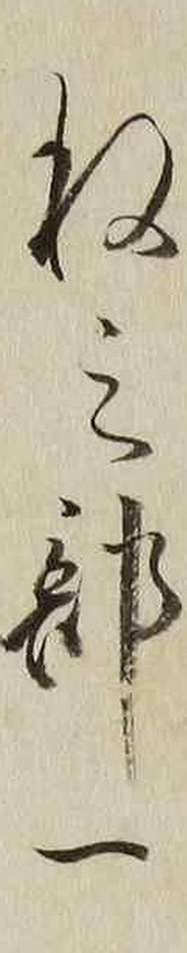ね之部一
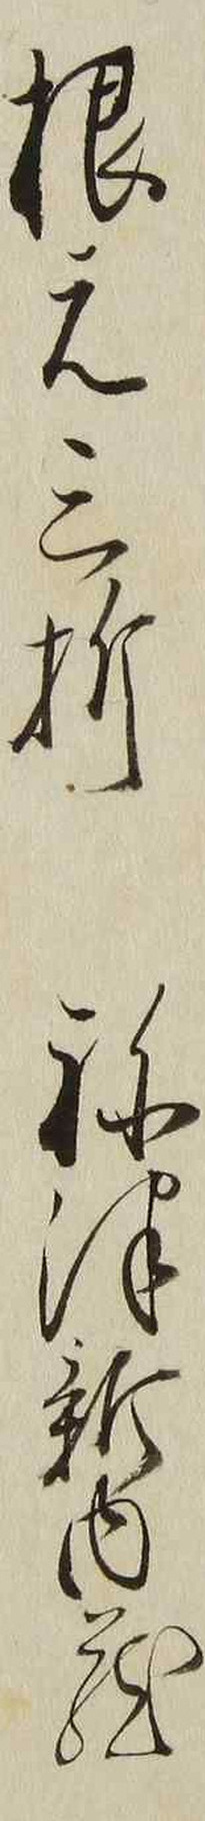根元三折禰津新内蔵
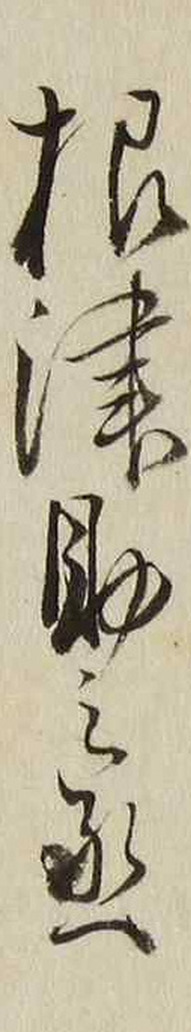根津助之丞

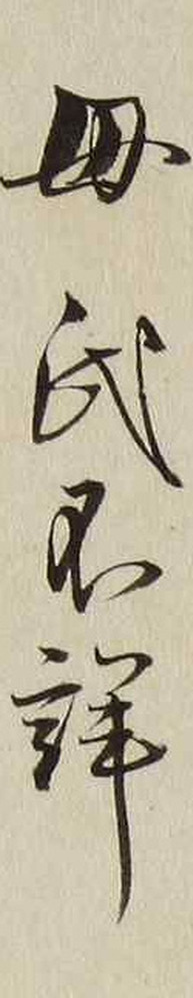母氏不詳
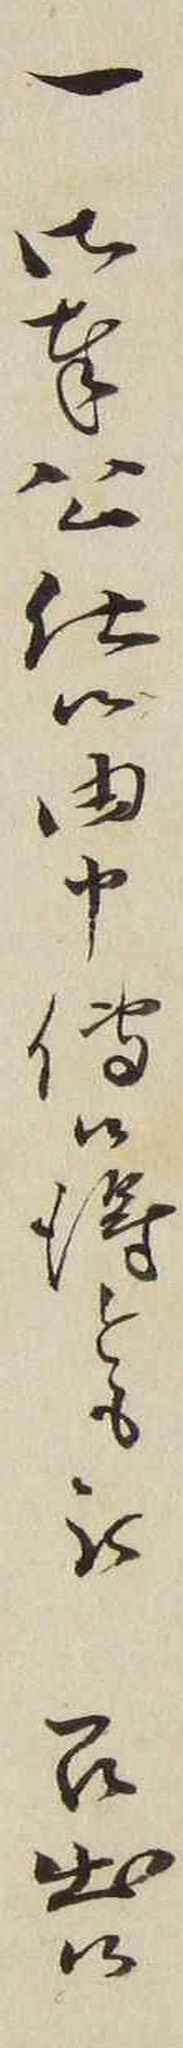一御奉公仕候由申伝候得とも被召出候

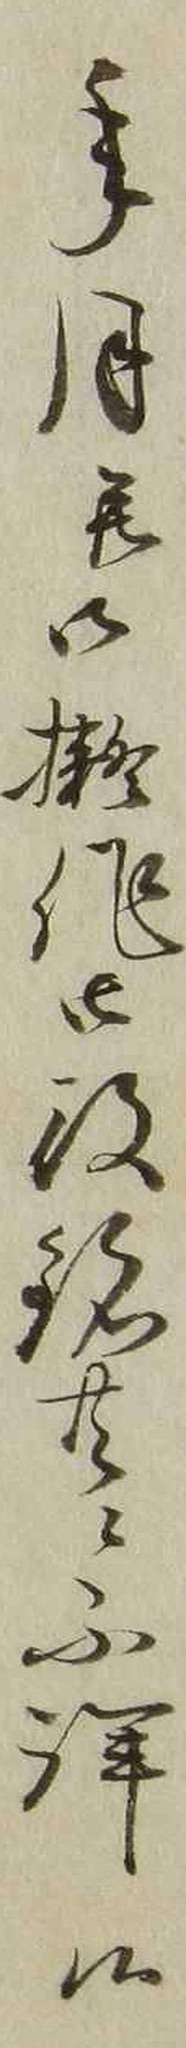年月并御擬作御役銘共に不詳候
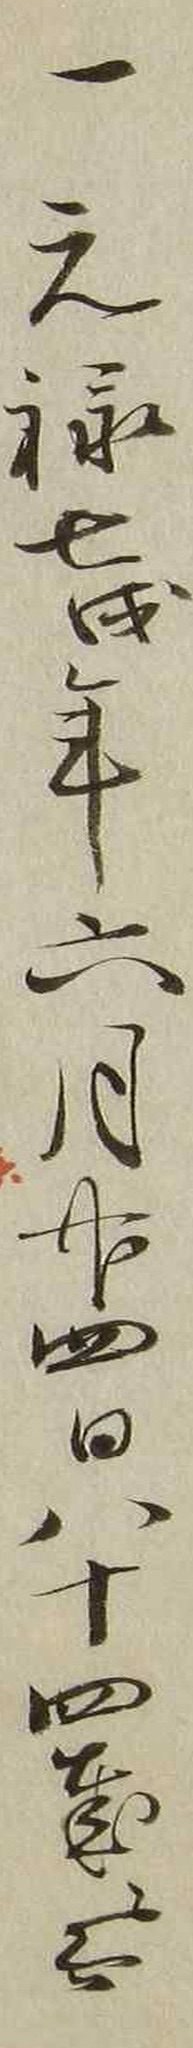一元禄七戌年六月廿四日八十四歳に而
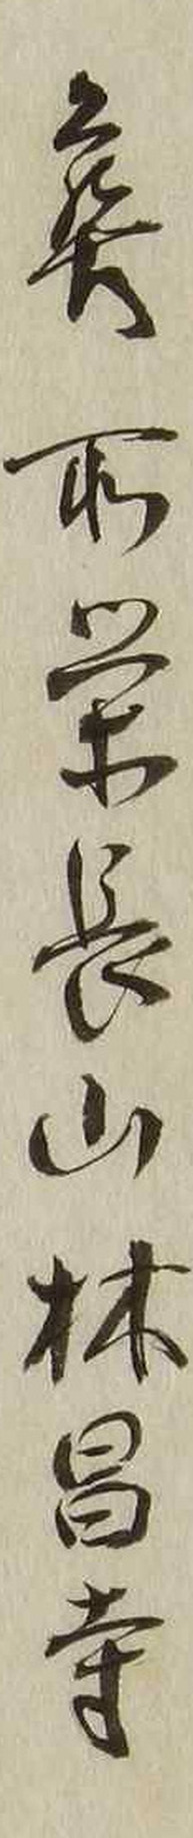葬所栄長山林昌寺
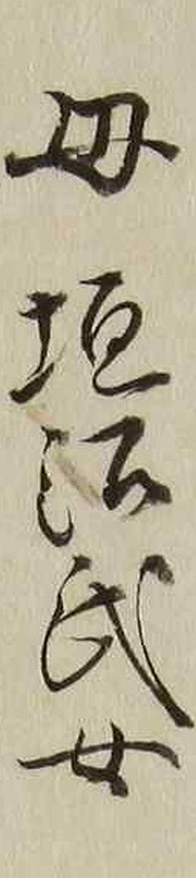母垣沼氏女
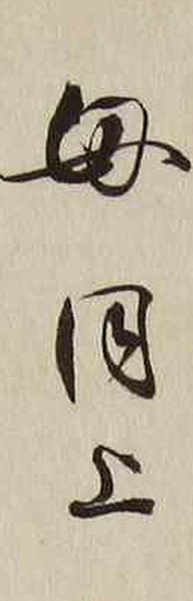母同上
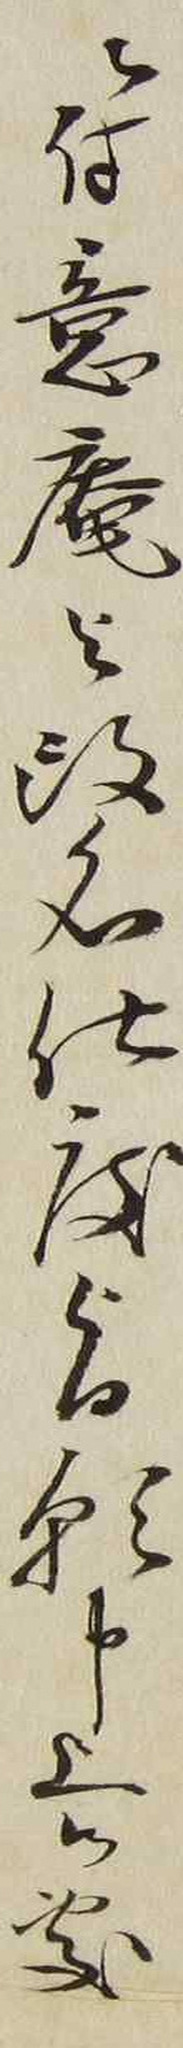に付意庵と改名仕度旨願申上候処
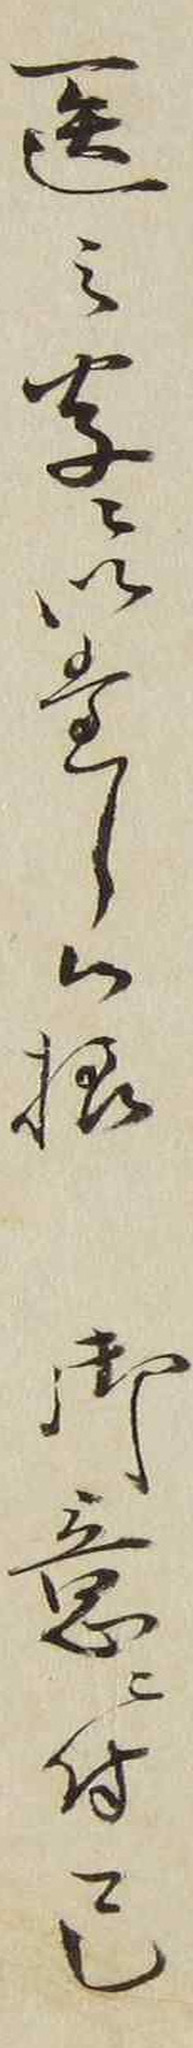医之字にいたし候様御意に付已

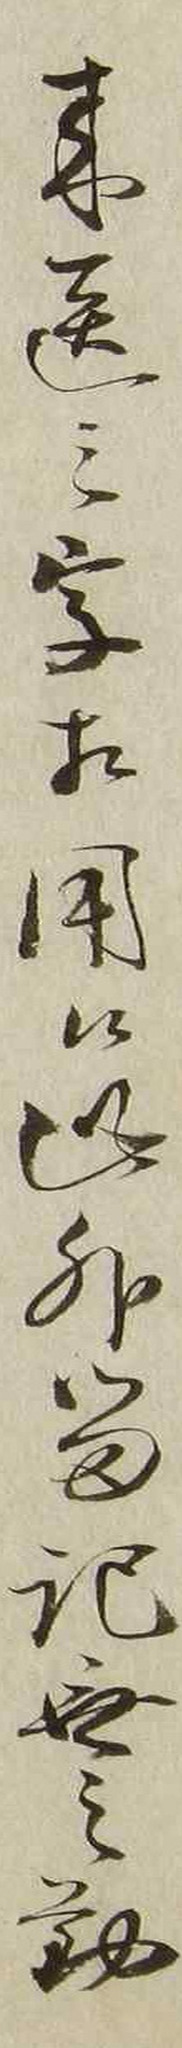来医之字相用候此外留記無之勤
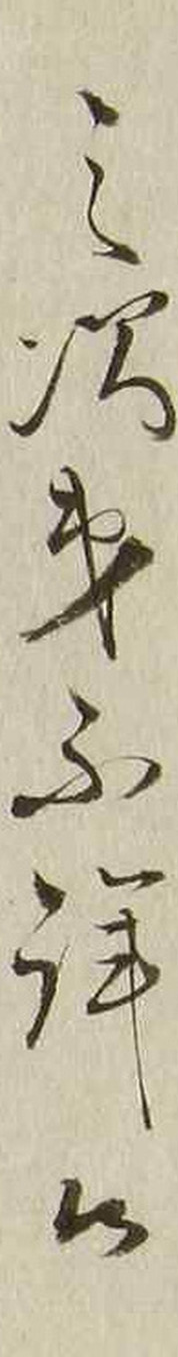之次第不詳候
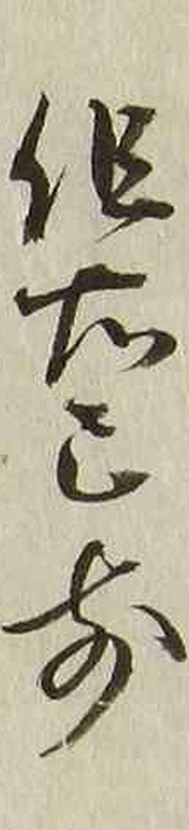但右已前
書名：諸士系譜　巻之157　ね之部1
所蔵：会津若松市立会津図書館
